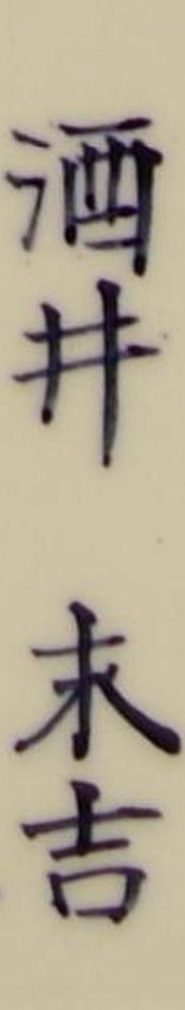酒井末吉
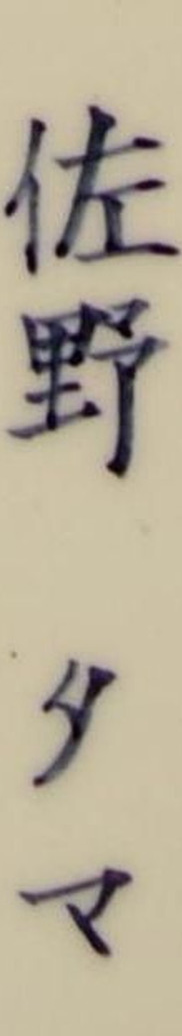佐野タマ
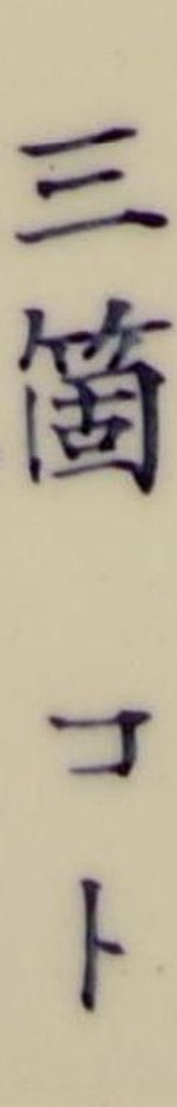三箇コト
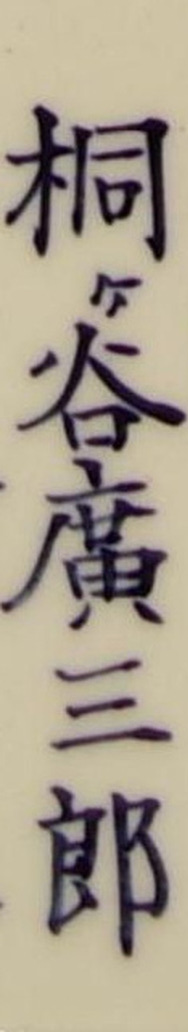桐ヶ谷廣三郎
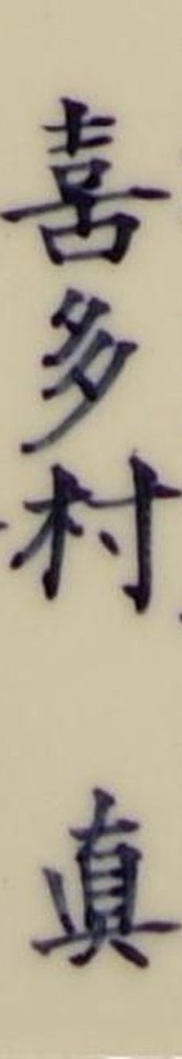喜多村真
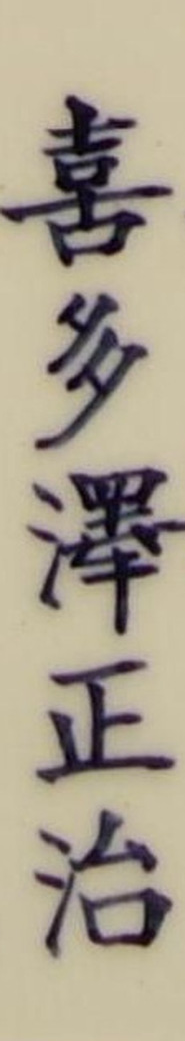喜多澤正治
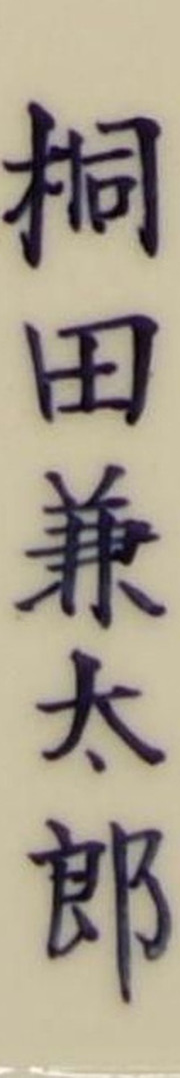桐田兼太郎
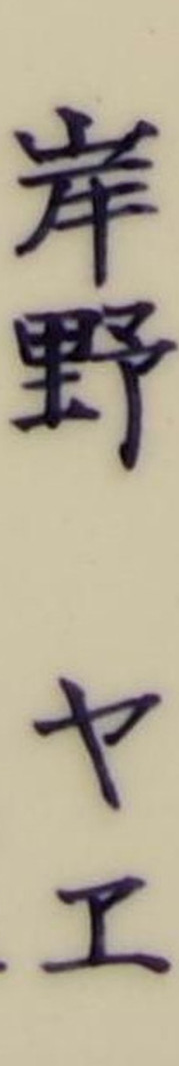岸野ヤエ
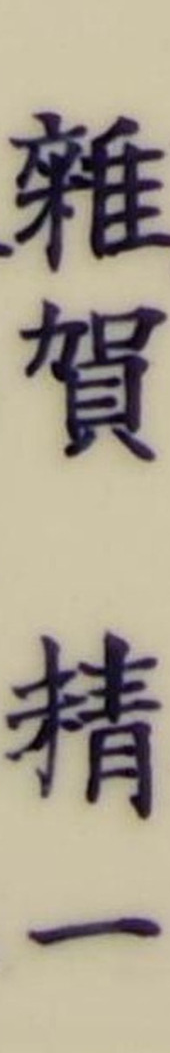雑賀精一
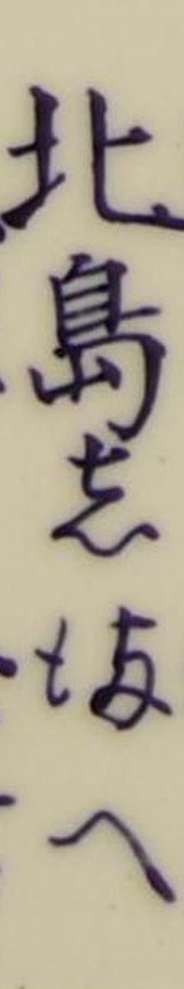北島しまへ
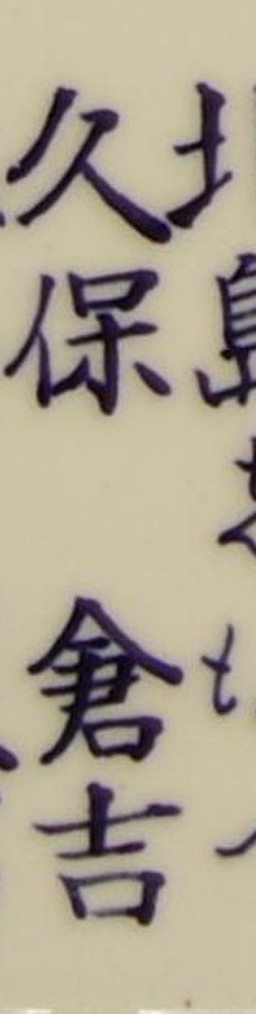久保倉吉
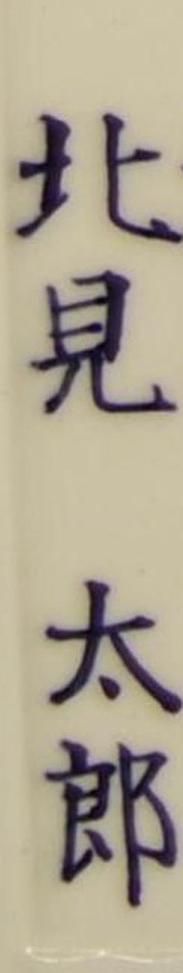北見太郎

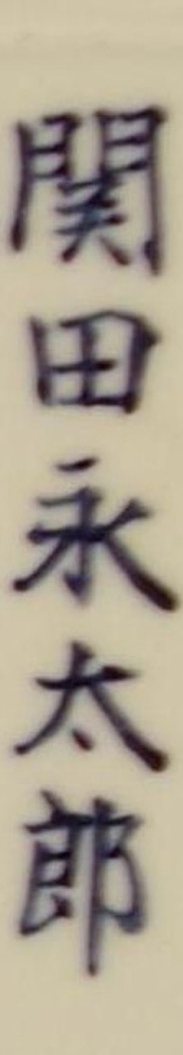関田永太郎
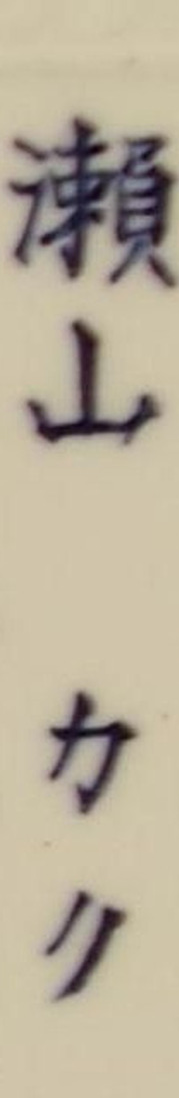瀬山カク
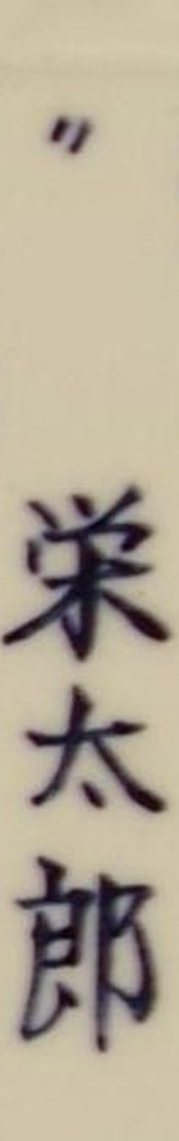栄太郎
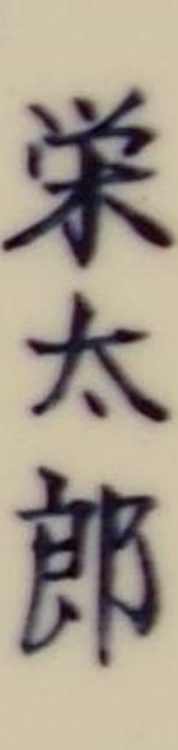栄太郎
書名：E~L
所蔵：高野山金剛峯寺
